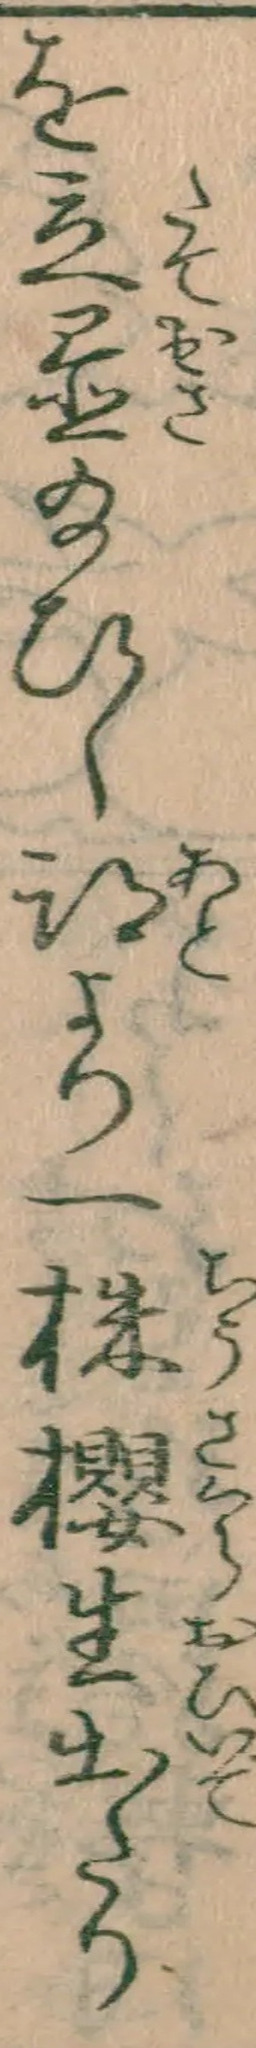を立置給ひし跡より一株桜生出たり
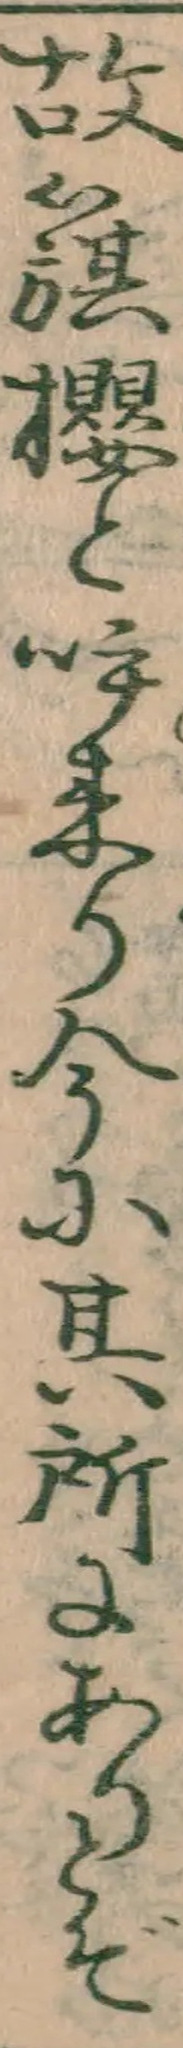故籏桜と呼来り今に其所にありとぞ

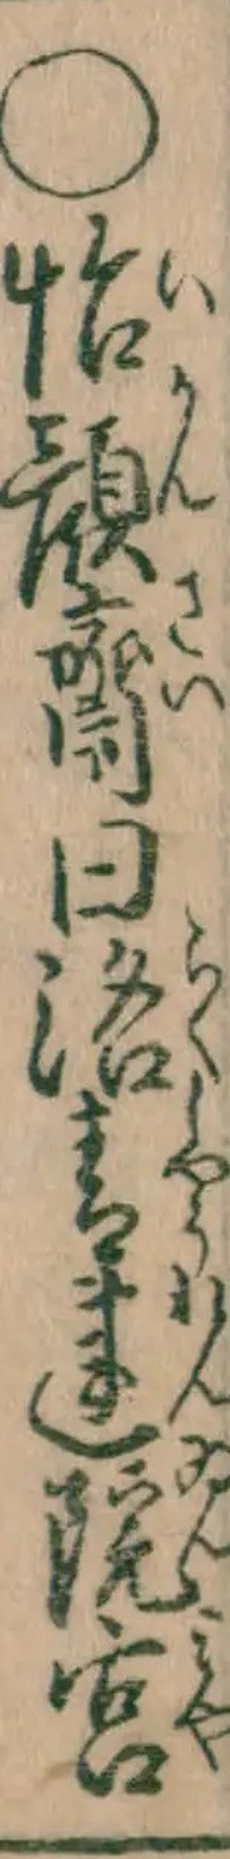○怡顔斎曰洛青蓮院宮
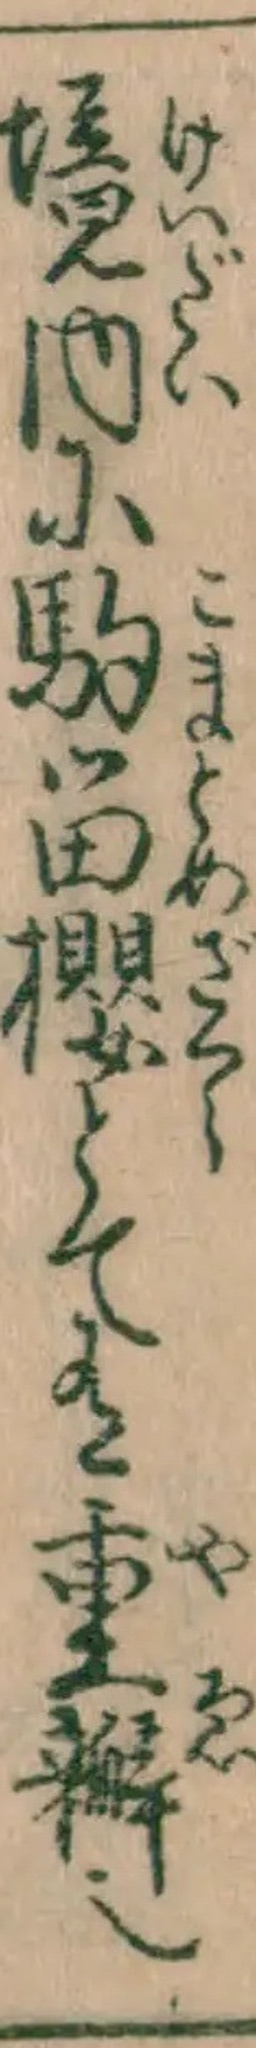境内に駒留桜とて有重弁也
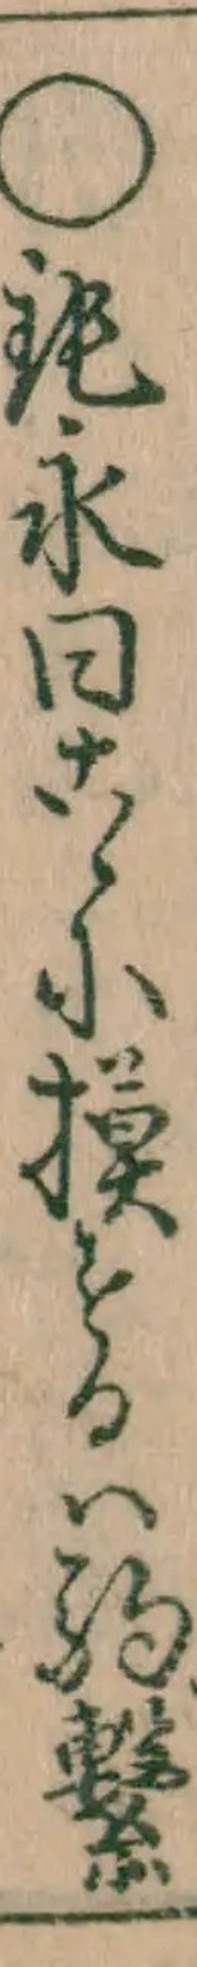○鈍永曰こゝに摸するは駒繋
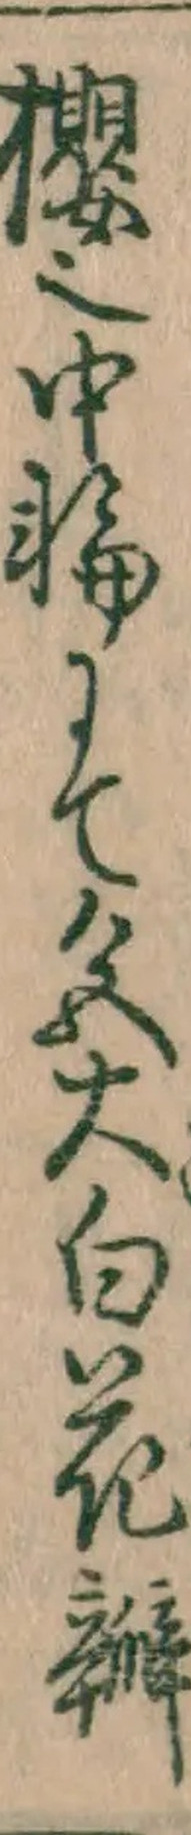桜也中輪にて色大白花弁
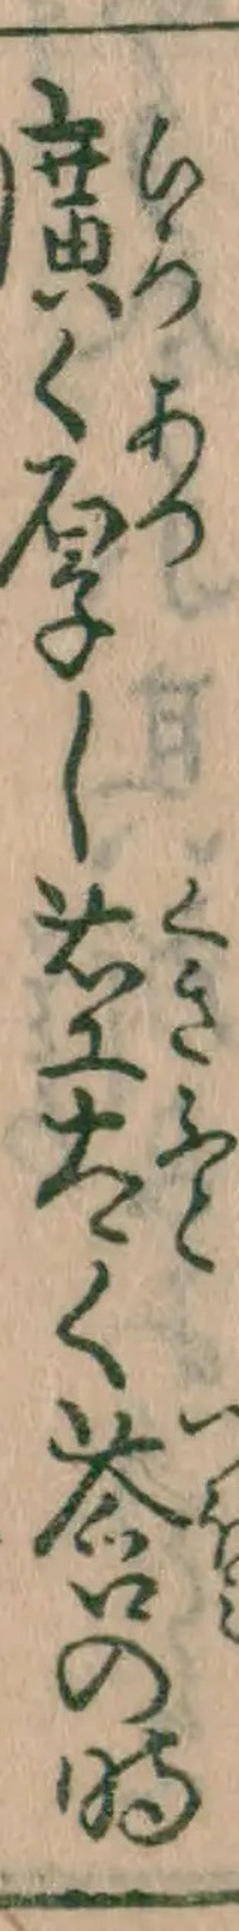広く厚し茎太く莟の時
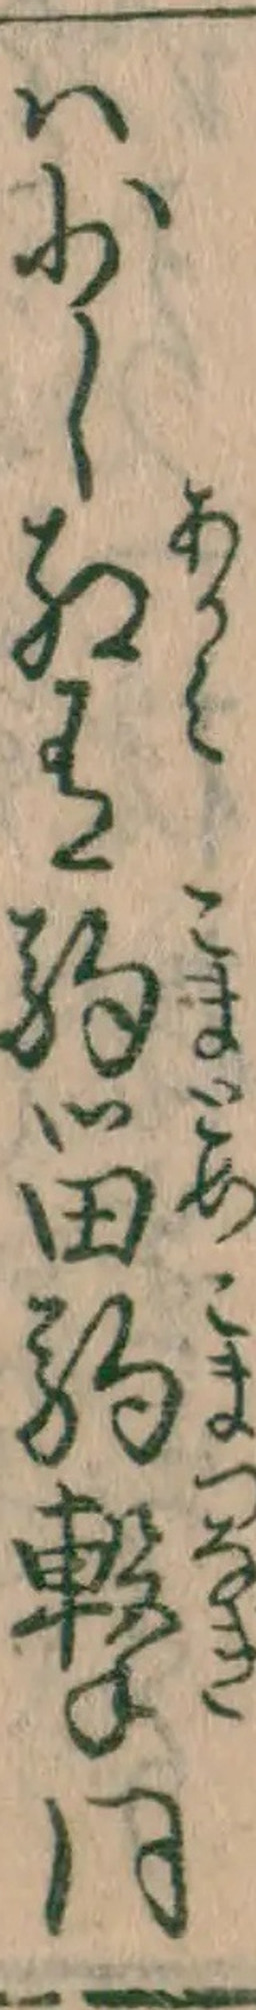は少し紅有駒留駒撃同
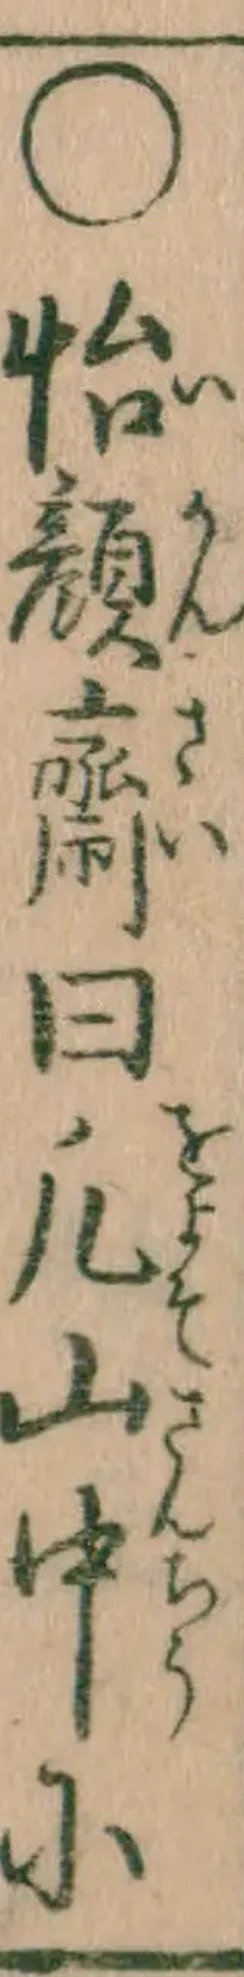○怡顔斎曰凡山中に
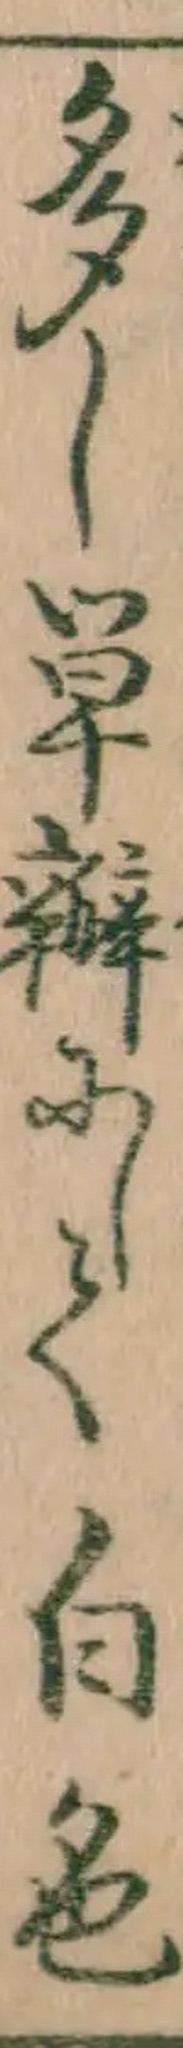多し単弁にして白色
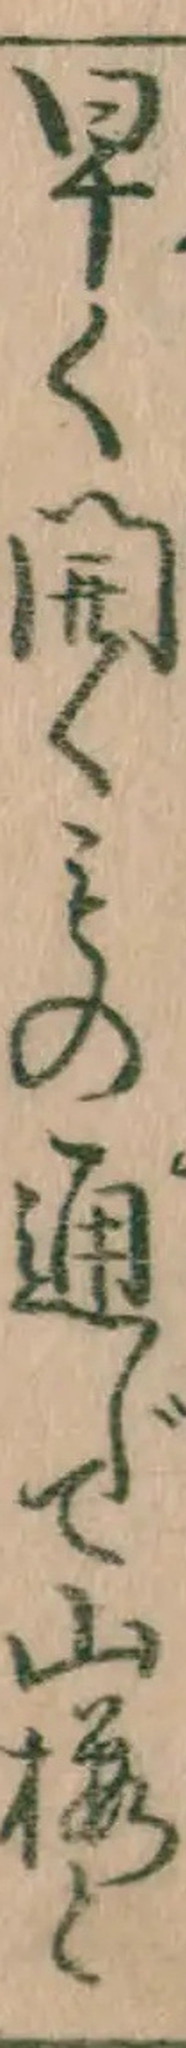早く開くもの通じて山桜と
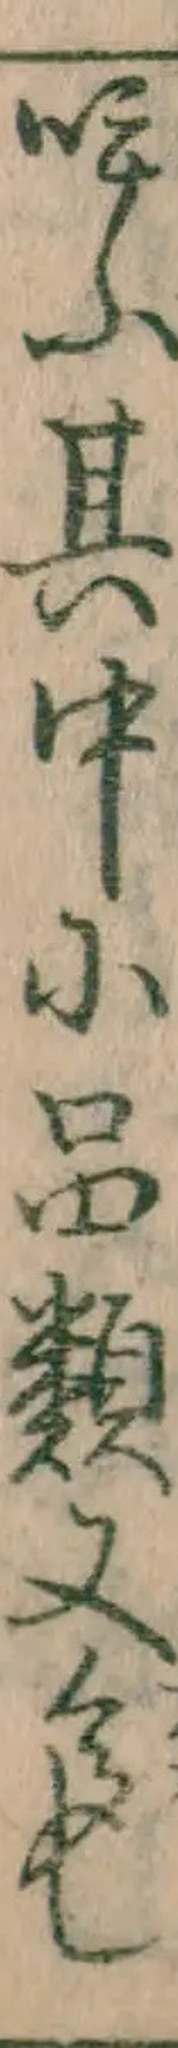呼ぶ其中に品類又多し
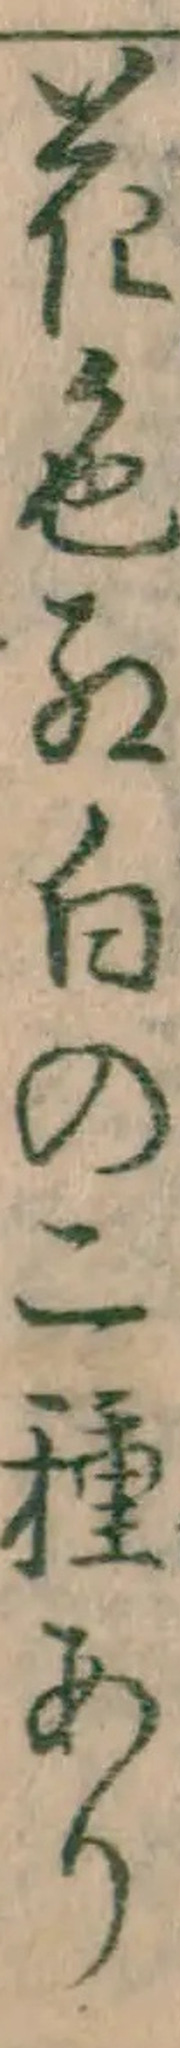花色紅白の二種あり
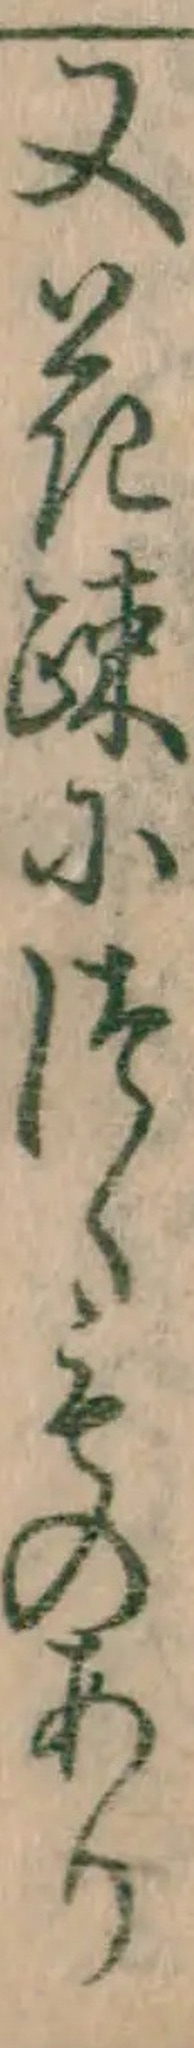又花疎につくものあり
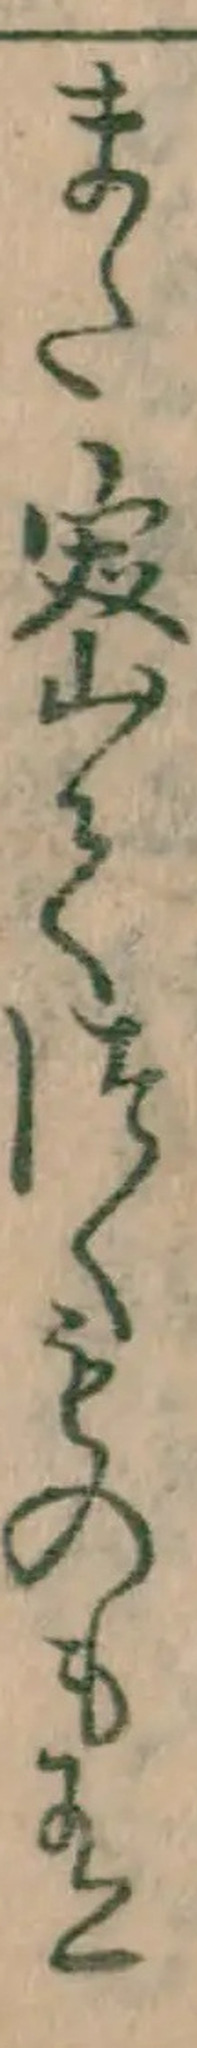また密てつくものも有

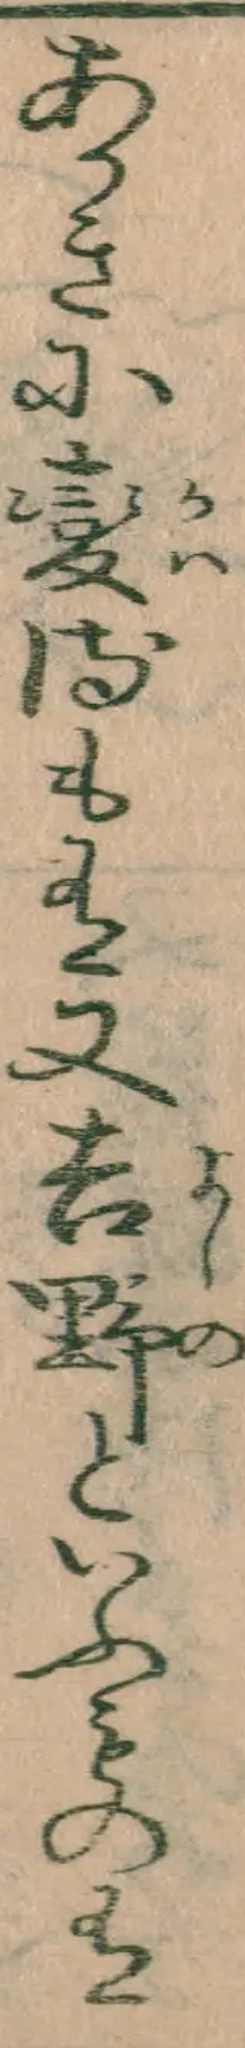あかきに変るも有又吉野といふもの有
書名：怡顔齋櫻品
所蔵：国立国会図書館 National Diet Library, JAPAN
